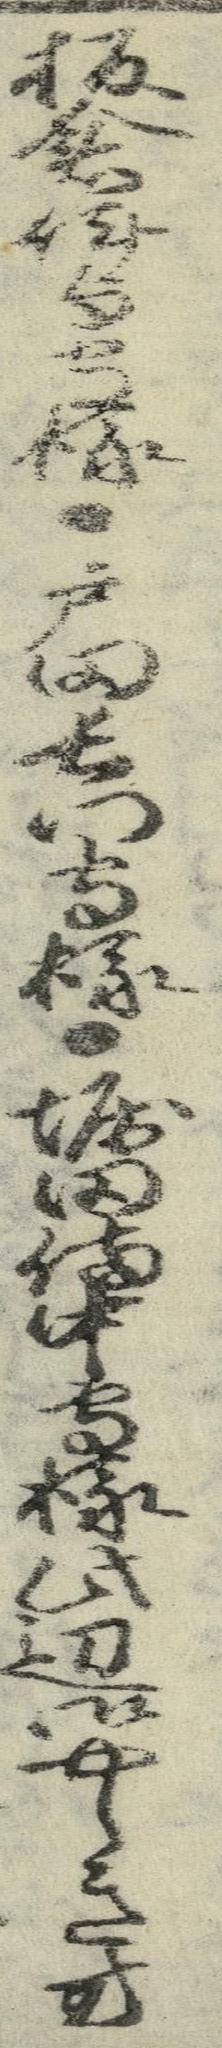板倉伊与守様●戸田長門守様●堀田備中守様此辺御やしき方

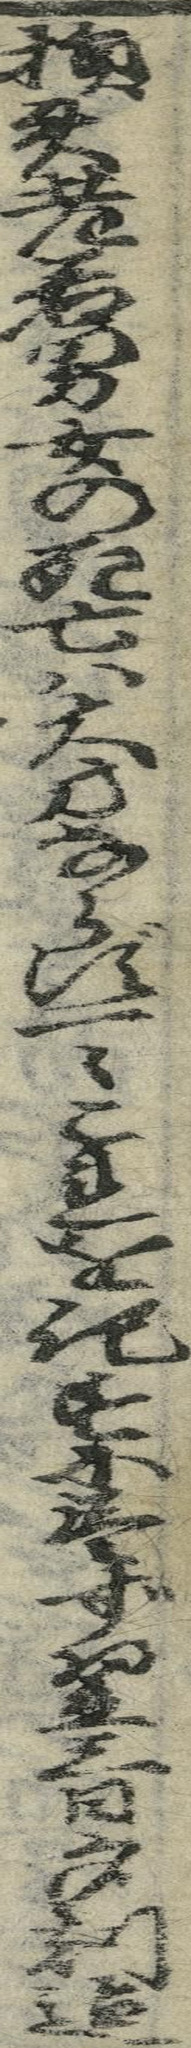損失老若男女の死亡は大方ならず一々これを記すに尽ず翌三日夕刻迄
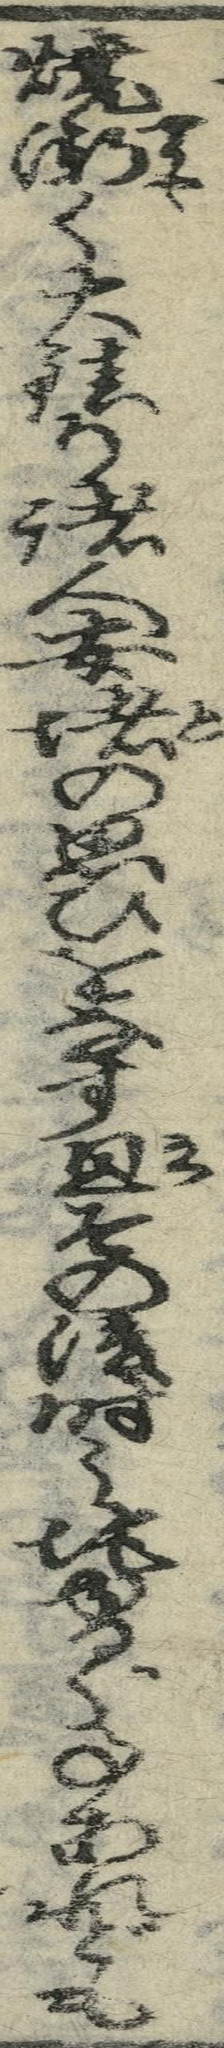焼漸く火鎭り諸人安堵の思ひをなす且その後時々地ゆるぐ事あれども
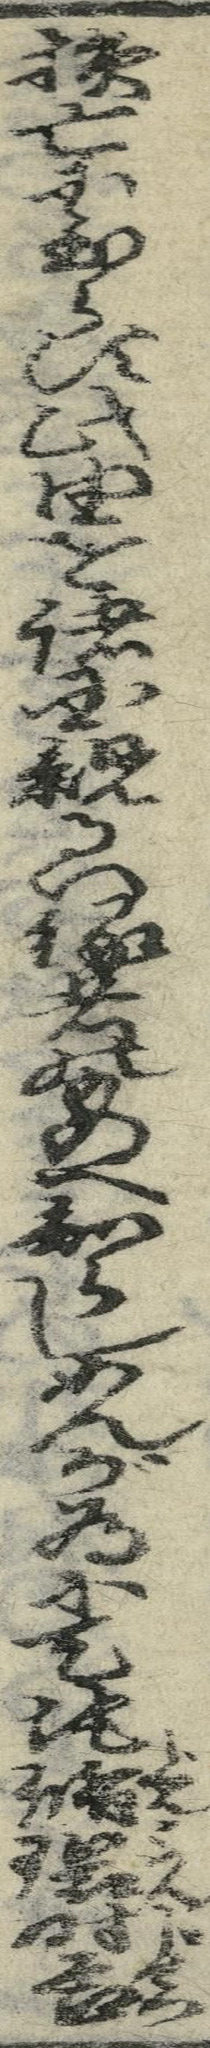損亡に至らす此由を諸国親るい縁者のものへ知らしめんが為に天地循環時節
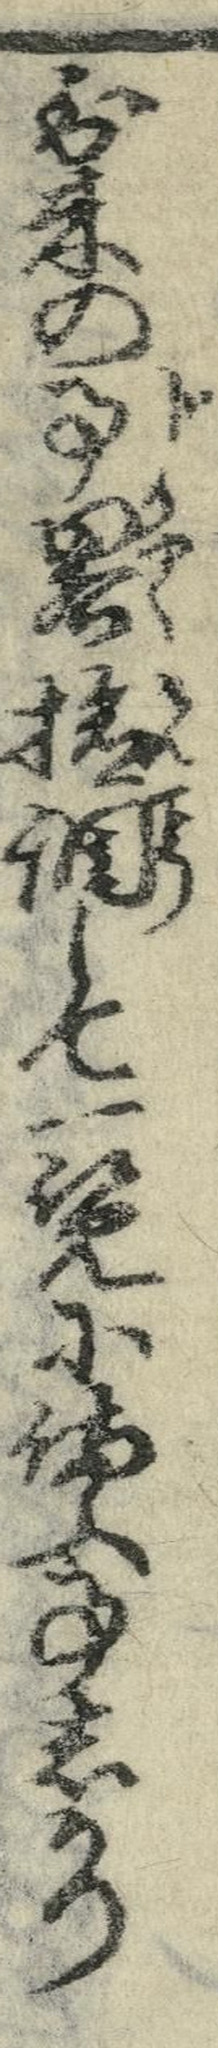出来の事略検調して一覧に伝ふ事しかり
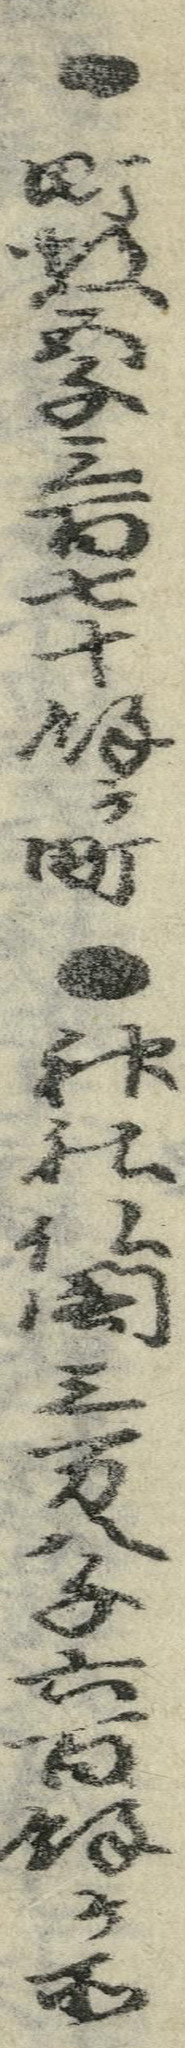●町数五千三百七十余ヶ町●神社仏閣三万八千六百余ヶ所
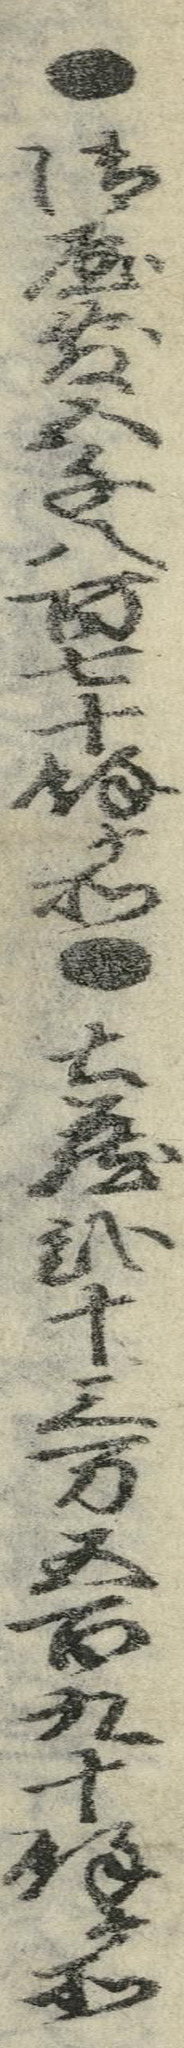●御屋敷五千八百七十余ヶ所●土蔵弐十三万五百九十余ヶ所
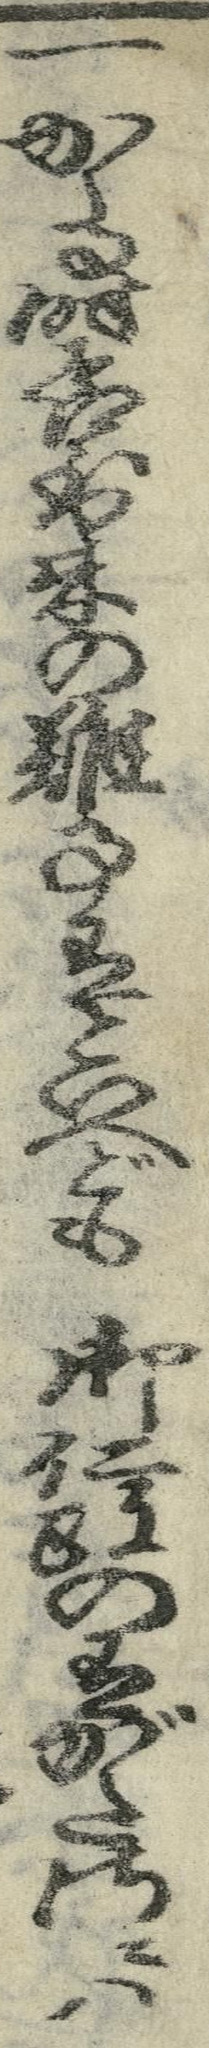一かゝる時節出来の難事有といへども御仁政の有がたさには
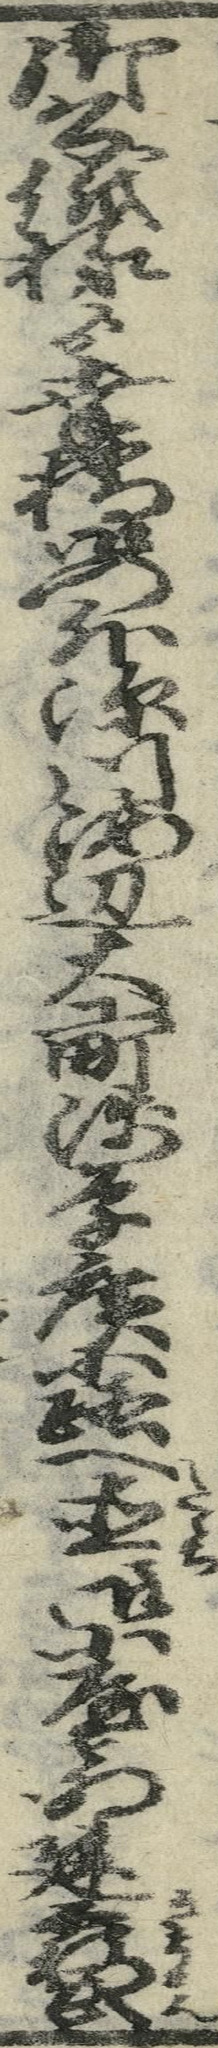御公儀様ゟ幸橋御門外深川海辺大工町浅草広小路へ直に御小屋被為建窮民
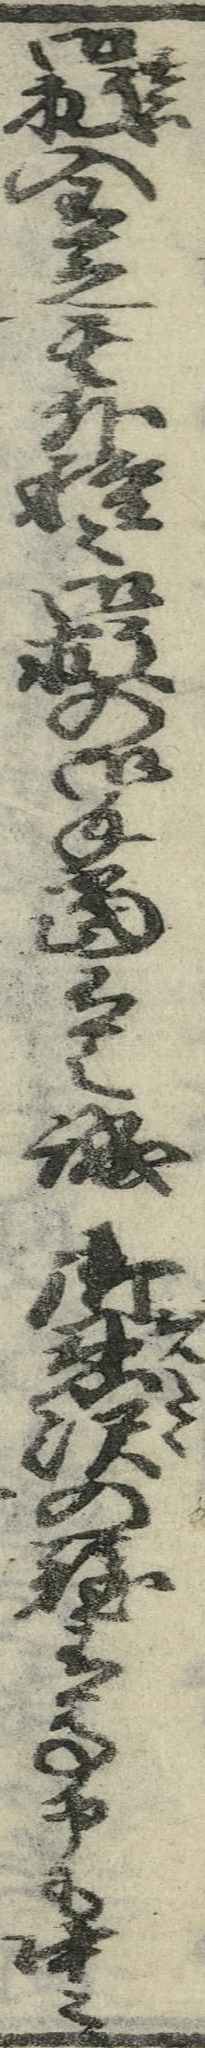御救入有之其外種々御救の御手当有之議御恩沢の難有事申も中〻
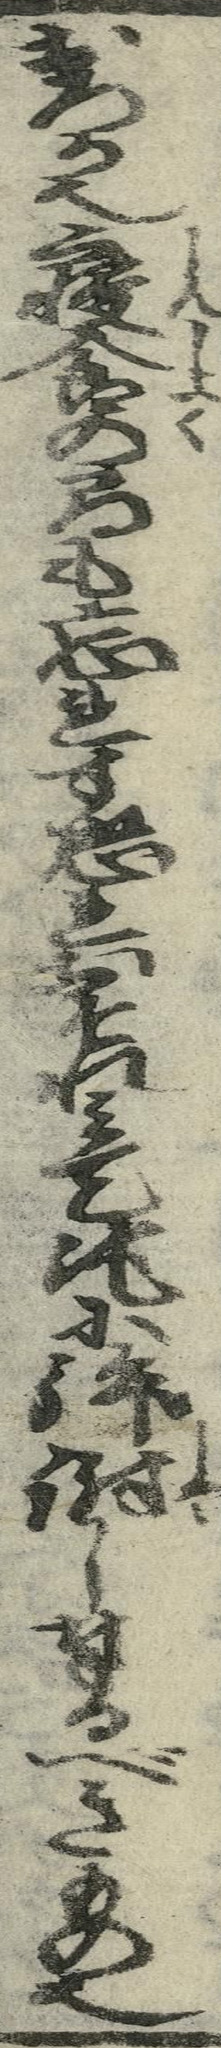おろか也寝食の間も忘れす恐れおそれ是非に拝謝し奉るべきもの也
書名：安政息災記　全
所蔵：東京大学地震研究所図書室 Earthquake Research Institute Library, The University of Tokyo, JAPAN
